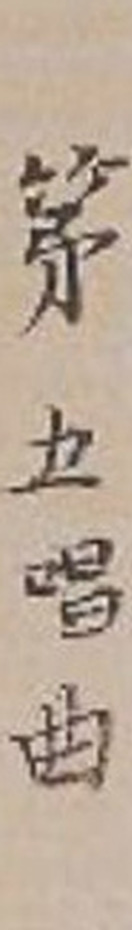第五唱曲
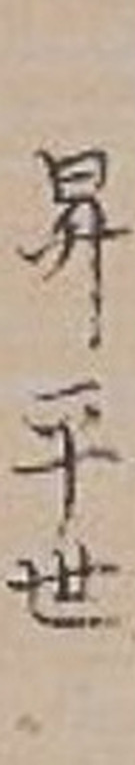昇平世
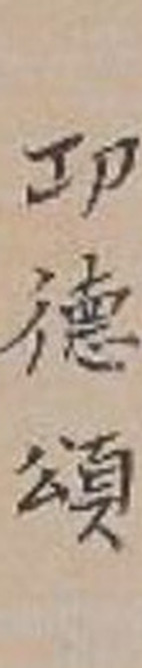功徳頌

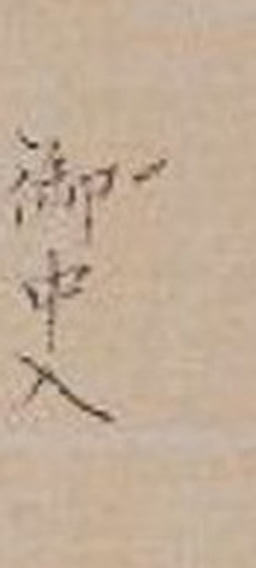御中入
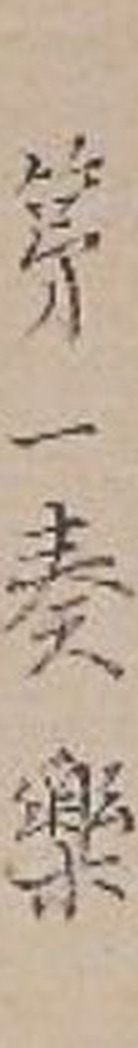第一奏楽
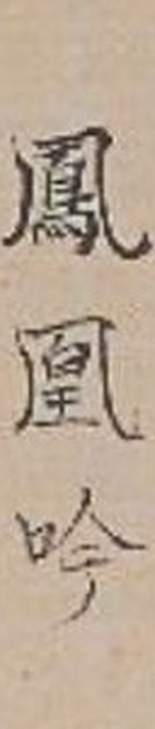鳳凰吟
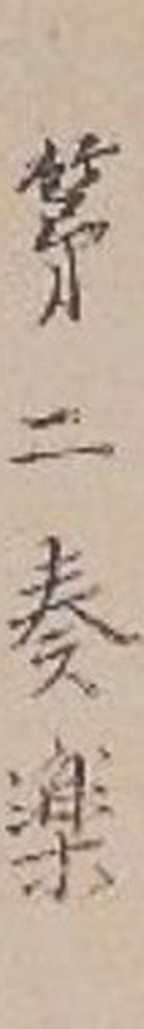第二奏楽
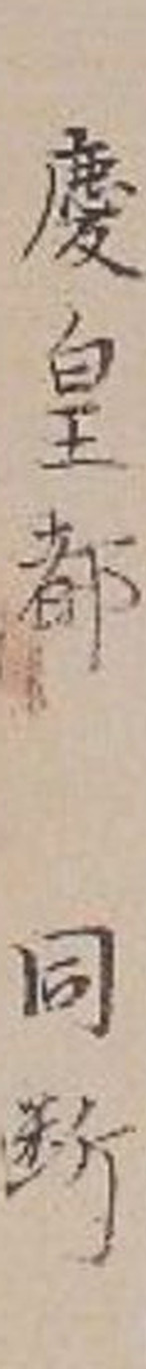慶皇都横断
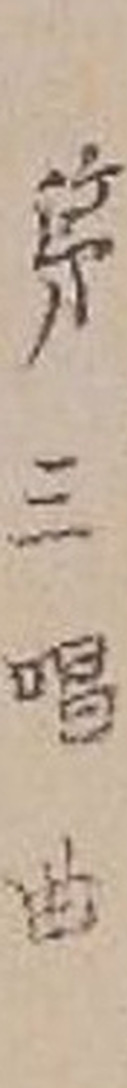第三唄曲

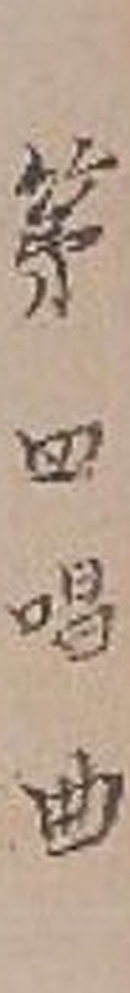第四唱曲
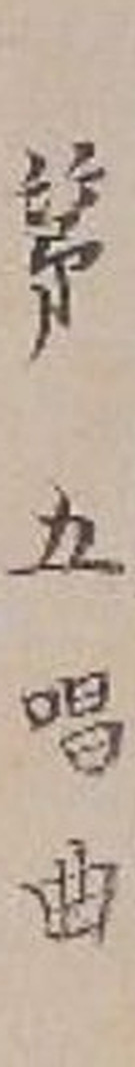第五唱曲
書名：琉球来聘志(仮) 天保十三年
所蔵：University of the Ryukyus Library
